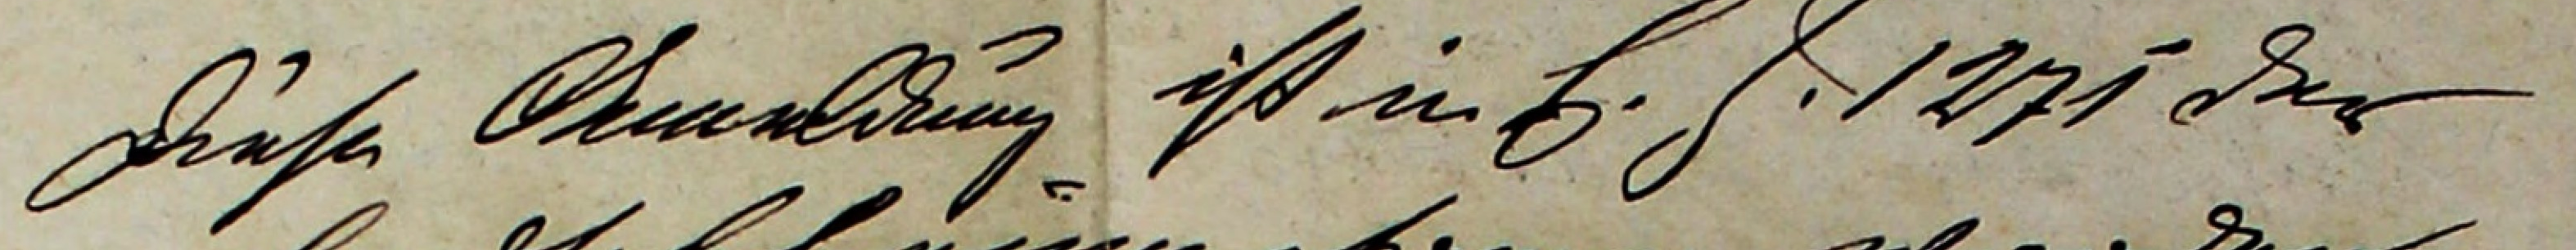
Diese Anmeldung ist in C. J. 1271 der
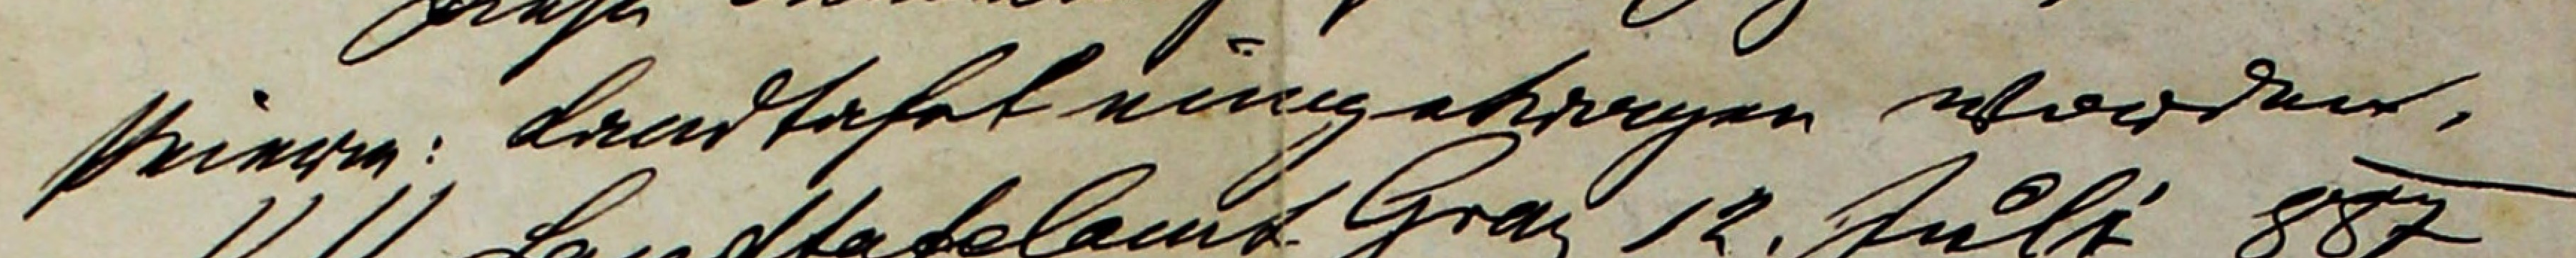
Peier???: Landtafel eingetragen worden,
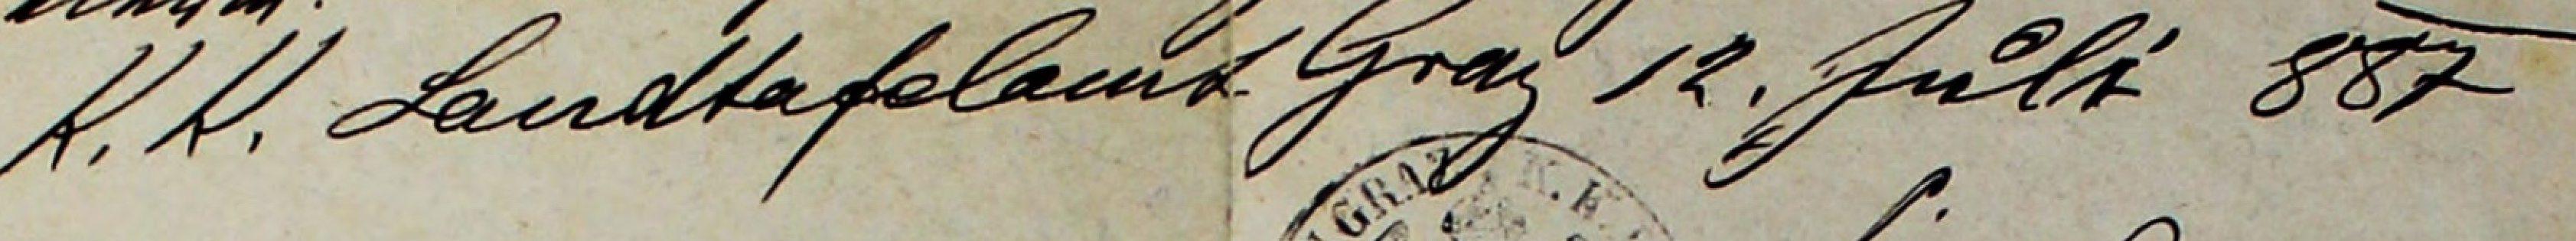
K.K. Landtafelamt. Gray 12. Juli 887
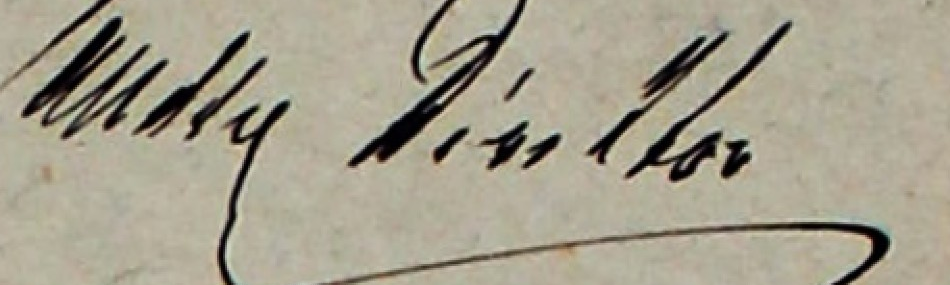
???
